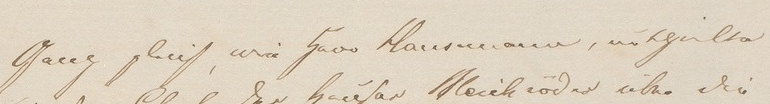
Ganz gleich, wie Herr Hansemann, urtheilte
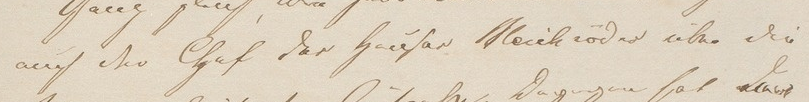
auch der Chef der Häuser Bleichröder über die
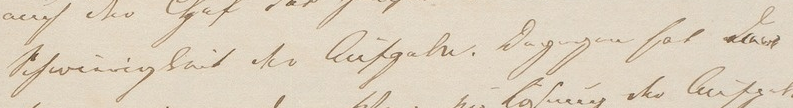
Schwierigkeit der Aufgabe. Dagegen hat der-
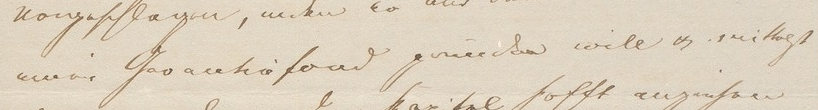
einen Garantiefond gründen will & mittelst
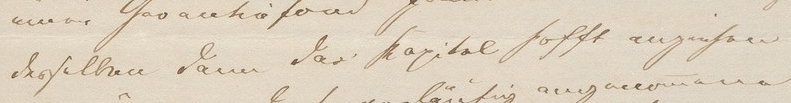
desselben dann das Kapital hofft anziehen
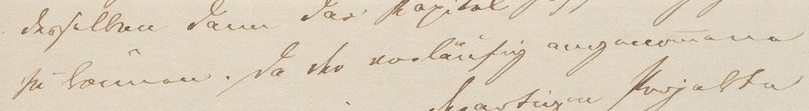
zu können. Da der vorläufig angenommene
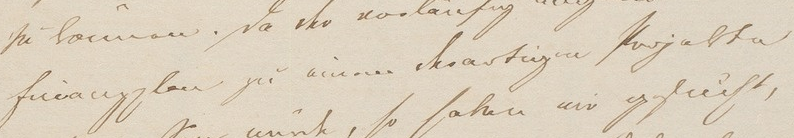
Finanzplan zu einem derartigen Projekte
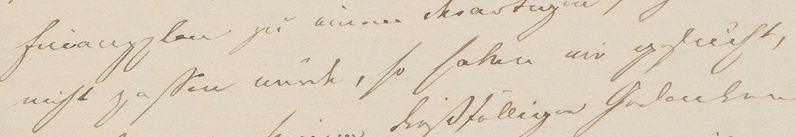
nicht paßen würde, so haben wir gesucht,
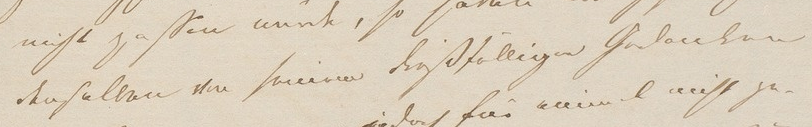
denselben von seinem dießfälligen Gedanken
